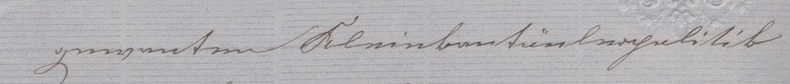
gewanten Kleinkantönlerpolitik
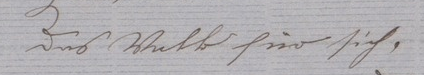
das Volk für sich.
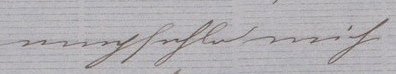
empfehle mich
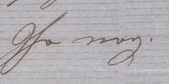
Ihr erg.
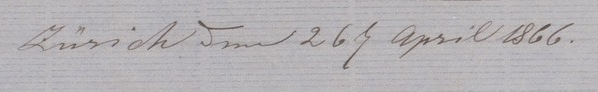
Zürich den 26ten April 1866.
